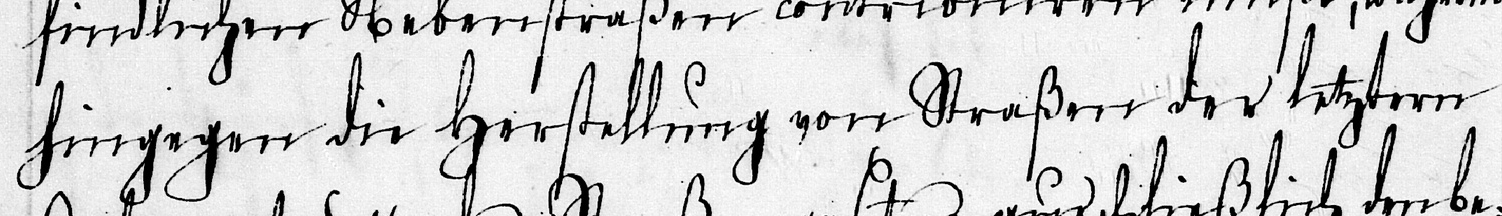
hingegen die Herstellung von Straßen der letztern
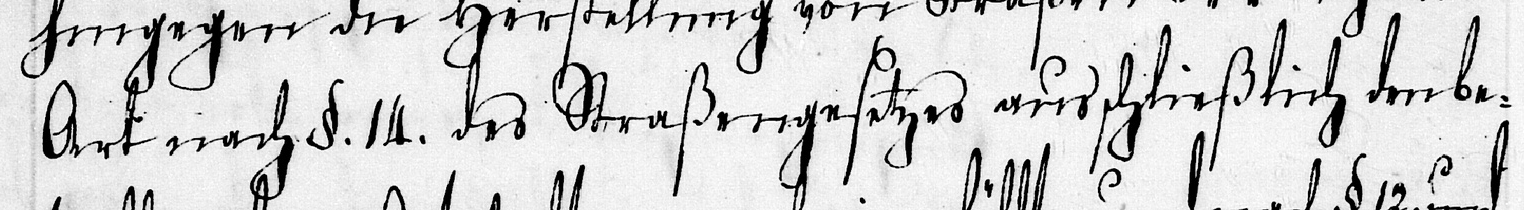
Art nach §. 14. des Straßengesetzes ausschließlich den be¬
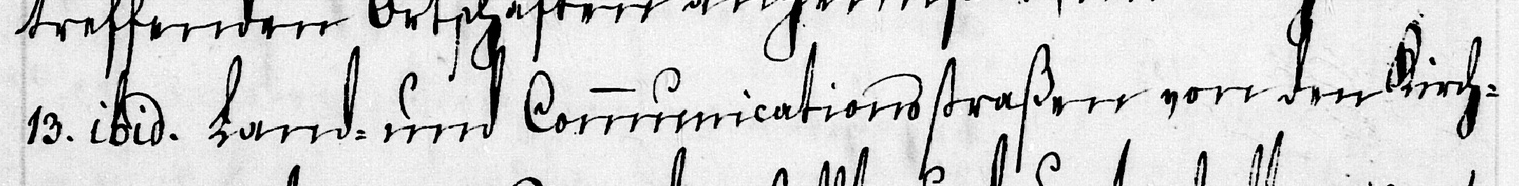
13. ibid. Land- und Communicationsstraßen von den Kirch¬
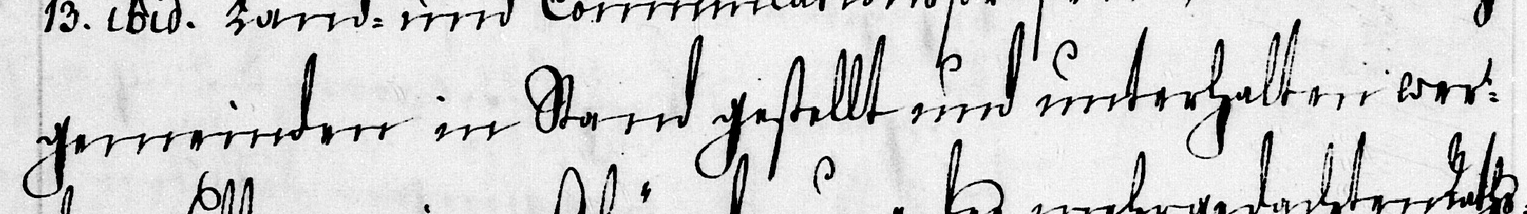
gemeinden in Stand gestellt und unterhalten wer¬
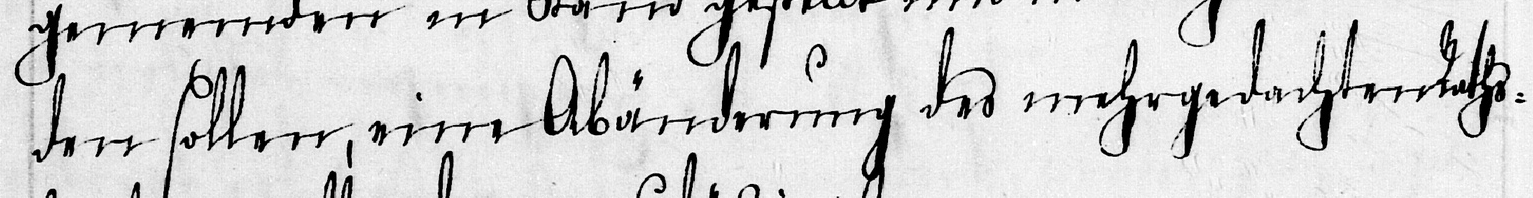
den sollen, eine Abänderung des mehrgedachten Rath¬
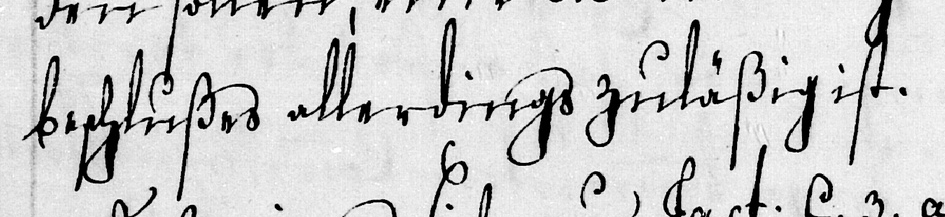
beschlußes allerdings zuläßig ist.
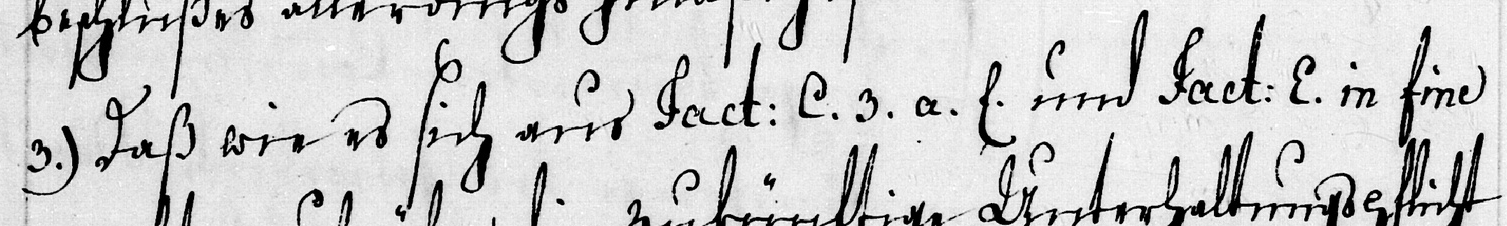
3.) Daß wie es sich aus Fact: C. 3. a. f[olgende]. und Fact:
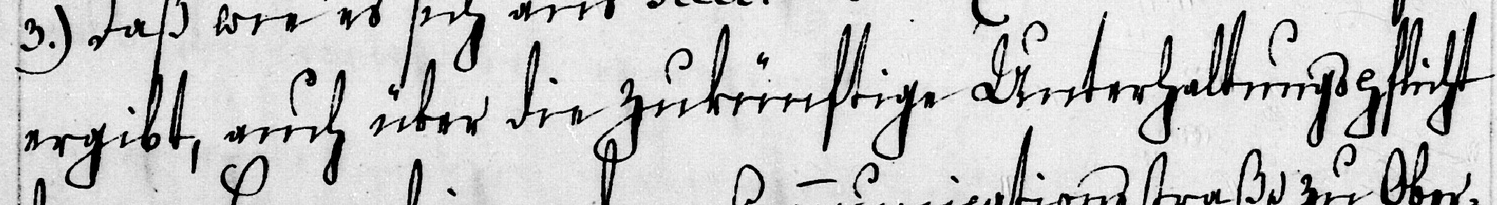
ergibt, auch über die zukünftige Unterhaltungspflicht
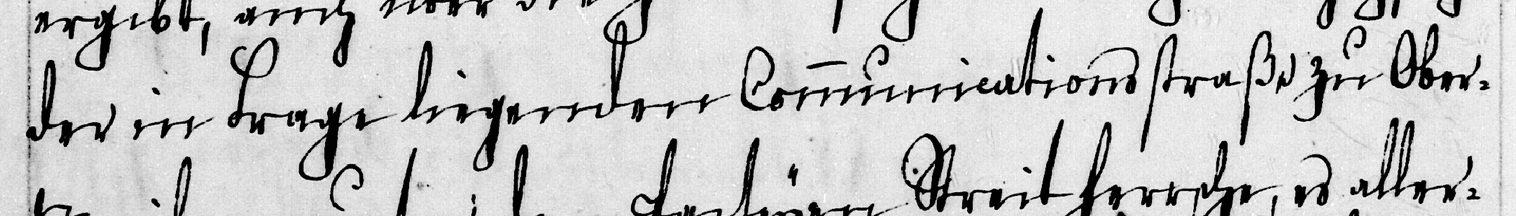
der in Frage liegenden Comunicationsstraße zu Obe¬
